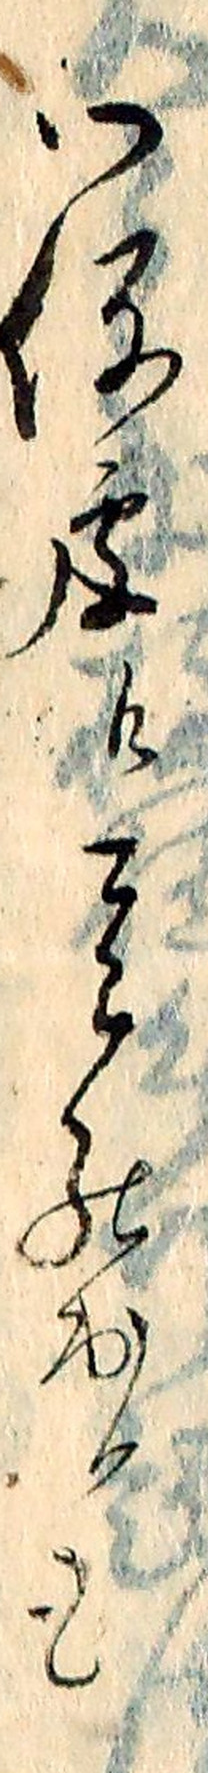御役処え可被罷出候以上
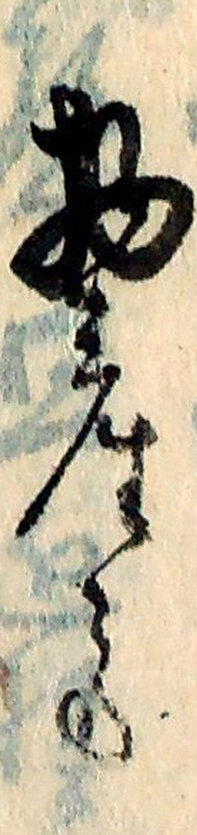物産方
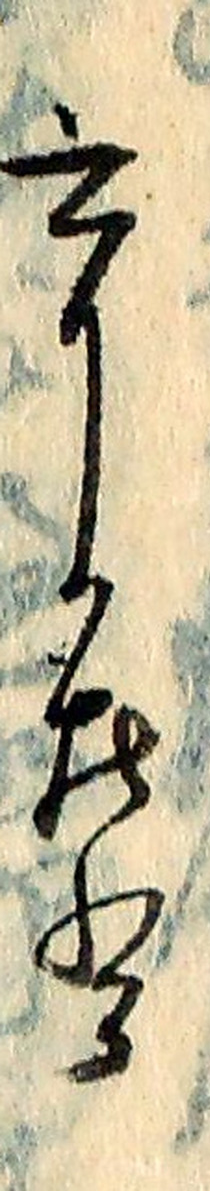六月廿五日
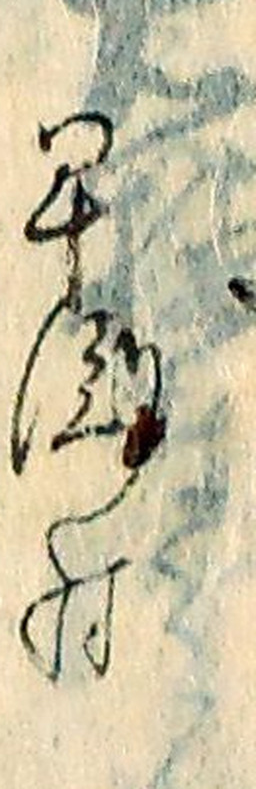平淵村
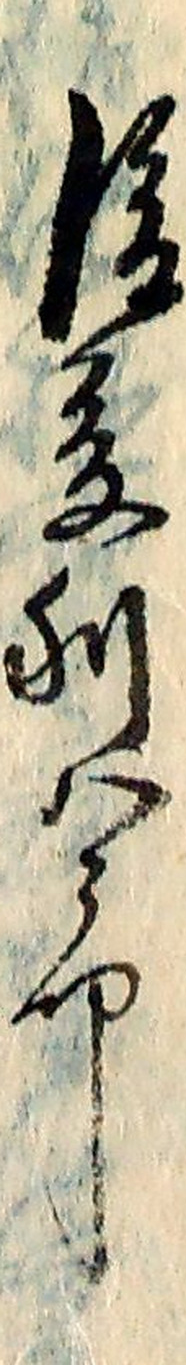後藤利八郎
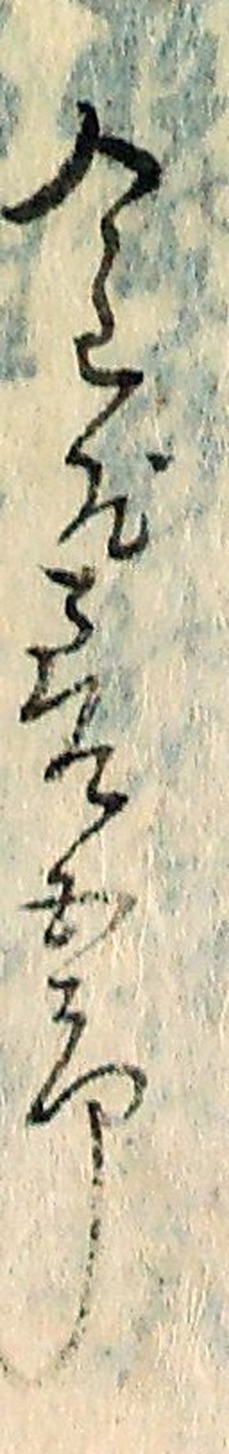金屋善五郎
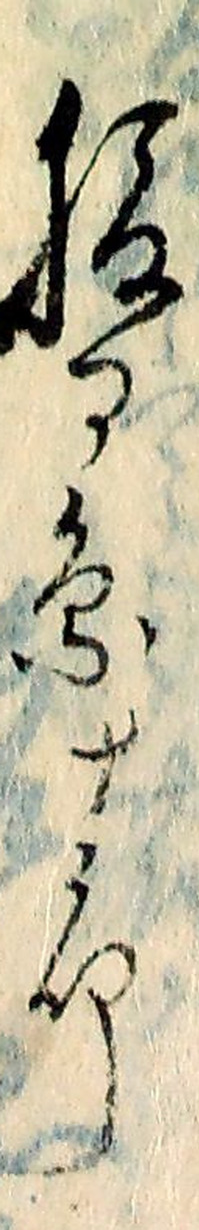服部円十郎
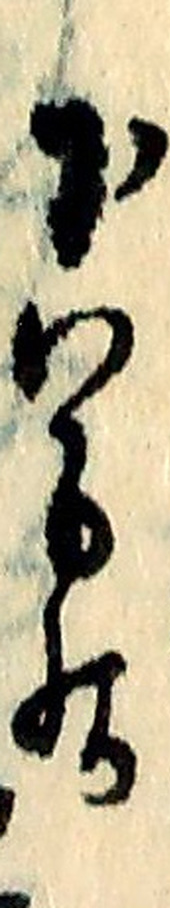下八万村
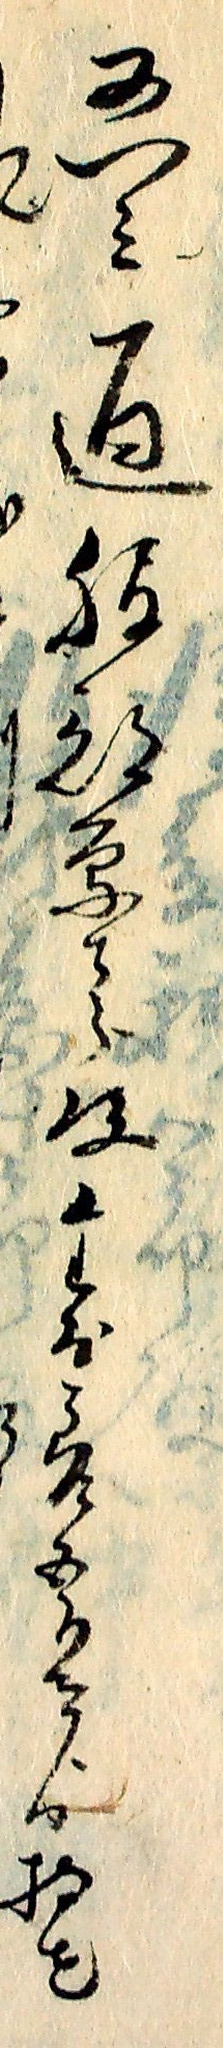右之通服部円十郎殿金屋善五郎殿ゟ持せ
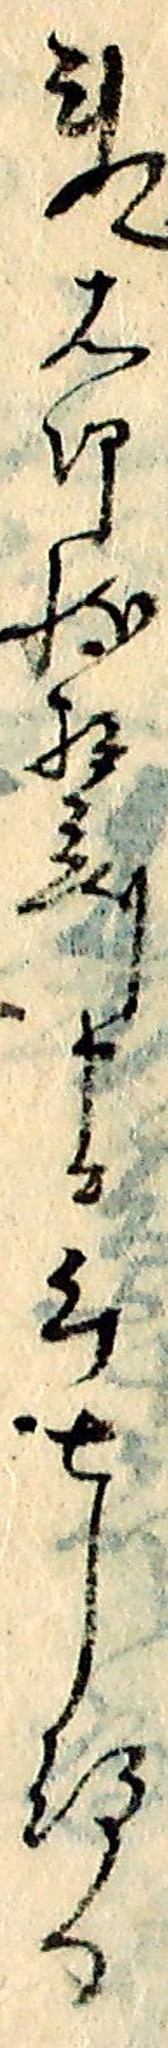来候右御状指戻し申候午七月朔日

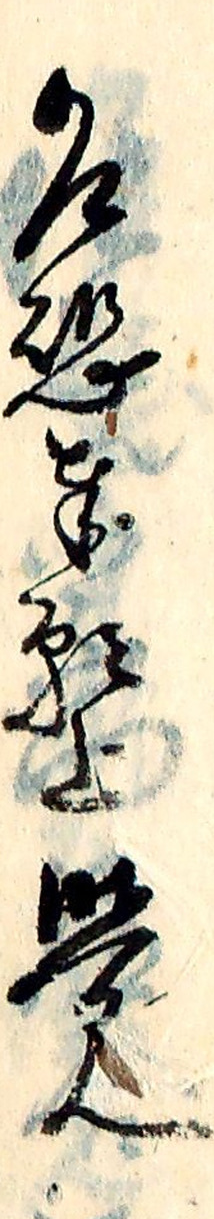乍恐奉願上覚
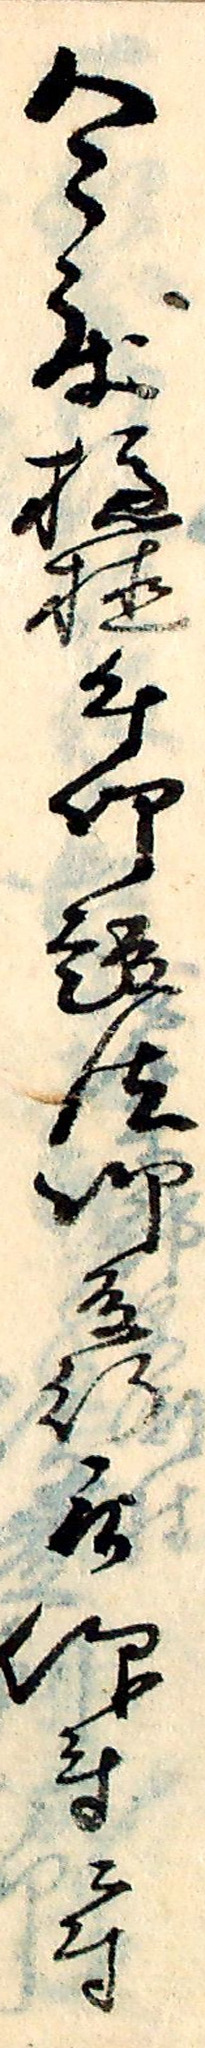今度櫨植付御趣法御取行被仰付に付
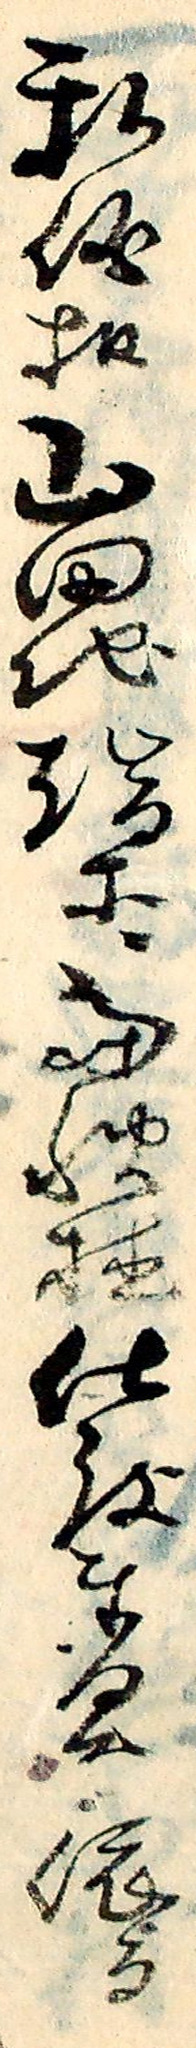私儀扣山田地端等に当秋植仕度奉存候依て
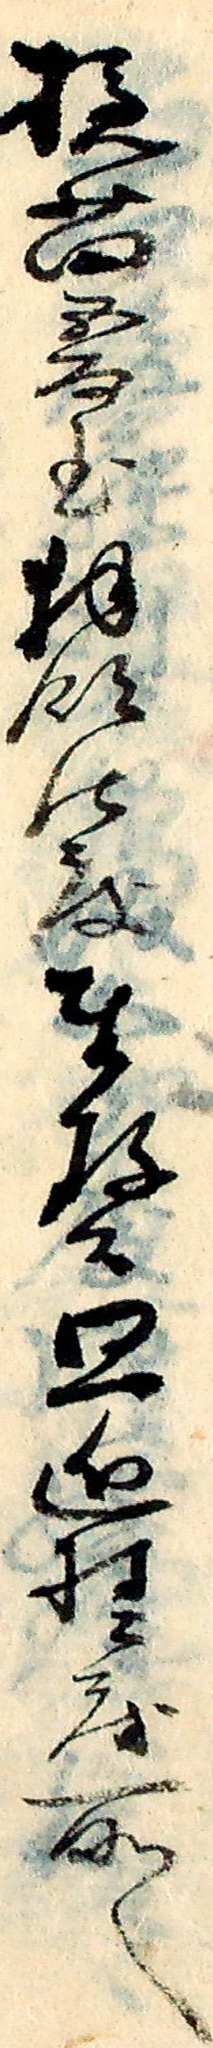櫨苗五百本拝領仕度奉存候且近村にも所々
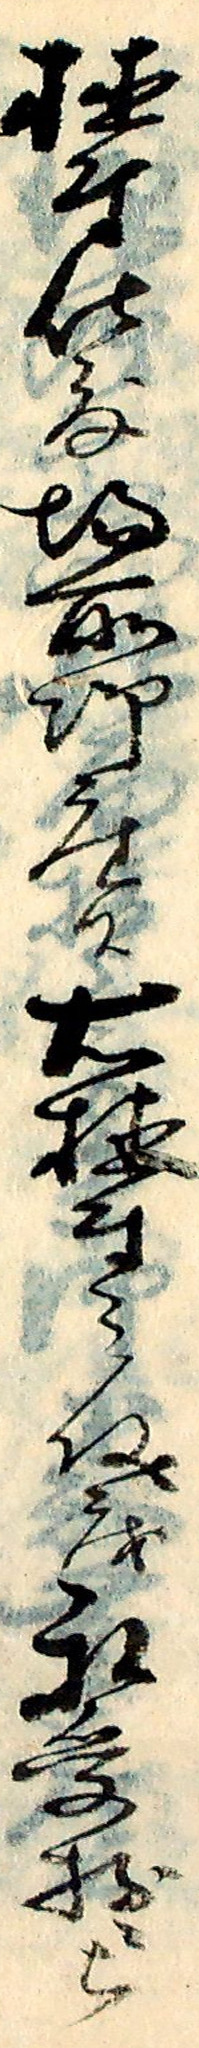植付仕度場所御座候右植付之儀も私受持に被
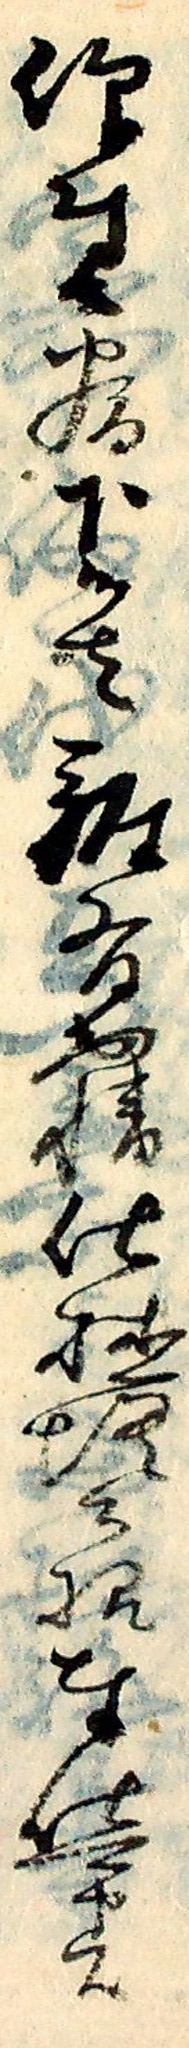仰付被為下候は難有出情仕植増候様奉仕可申候
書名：諸御願書控(後藤氏壱番）
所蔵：鳴門教育大学 Naruto University of Education
